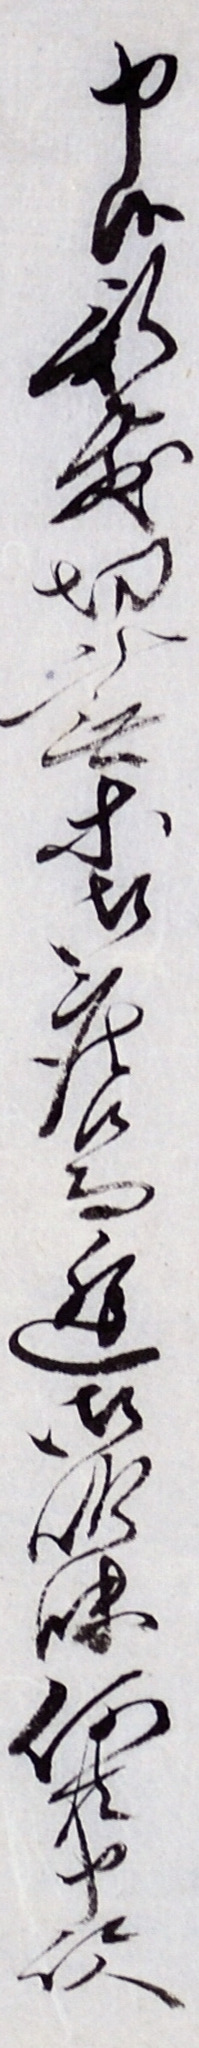申候新敷切蕪等御座候而逢御吟味何共申訳
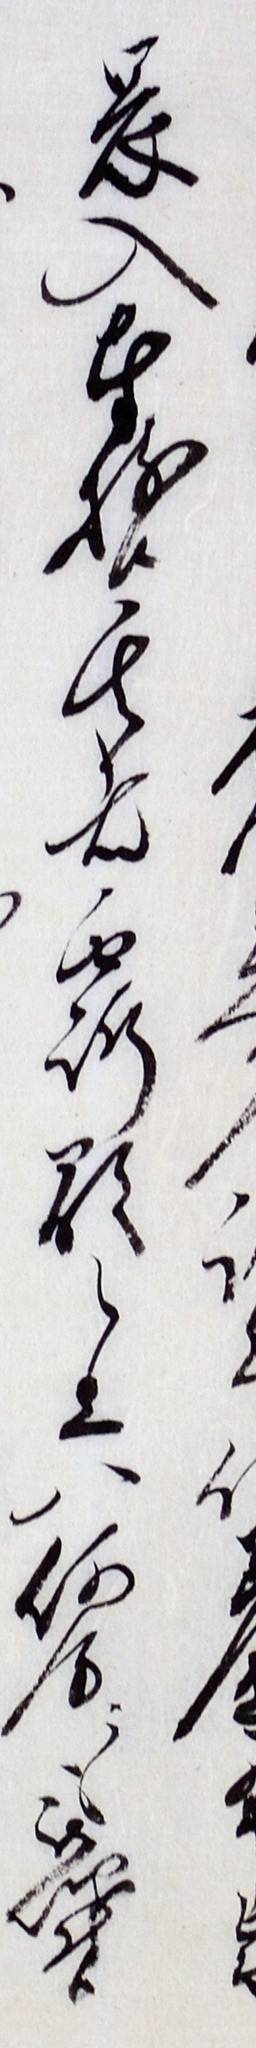畏入奉存候其者露顕之上ハ何分ニも被仰付候
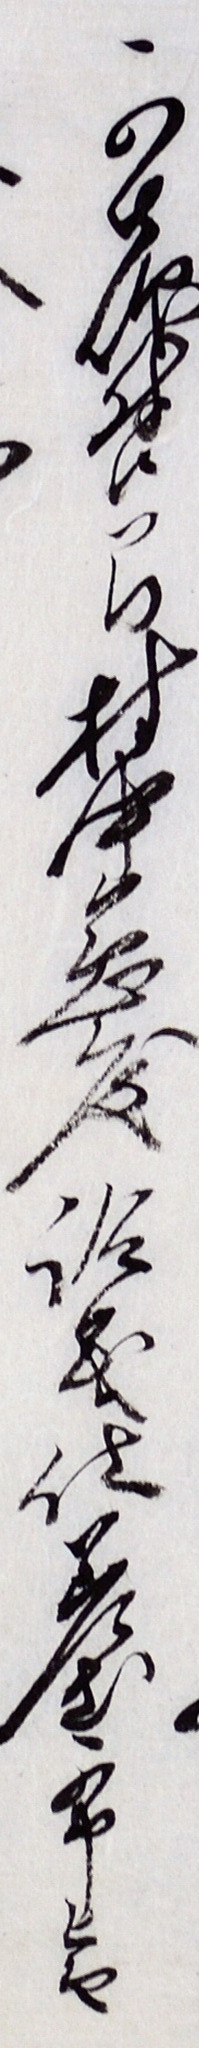可被仰付候間村中急度詮義仕差出可申旨
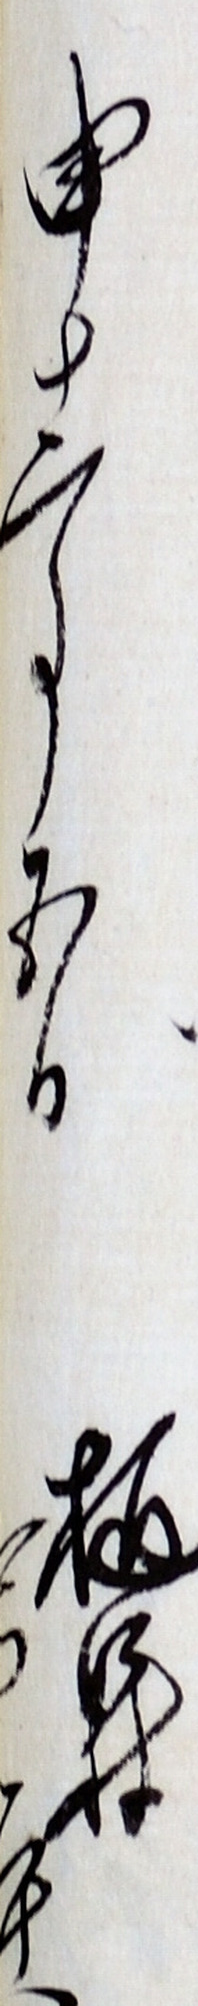申十二月五日樋口村
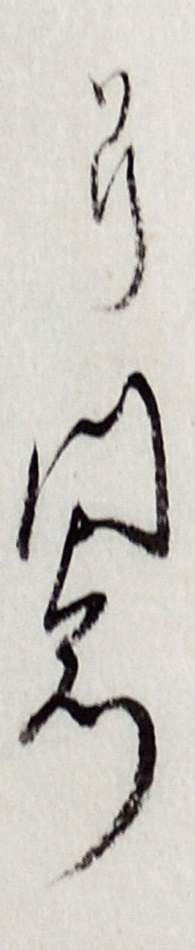同断門右衛門

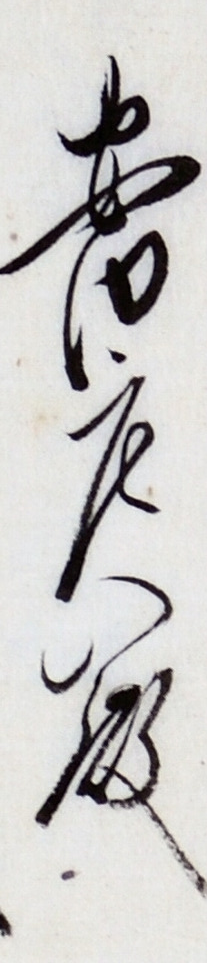安田庄八殿
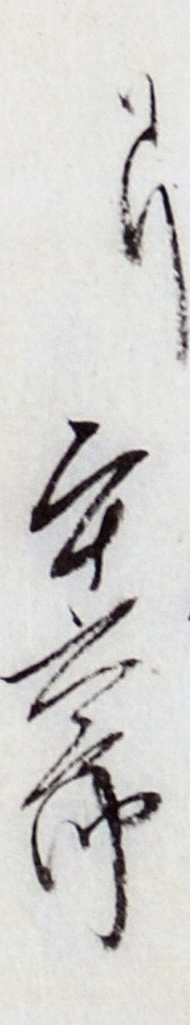同断平六郎
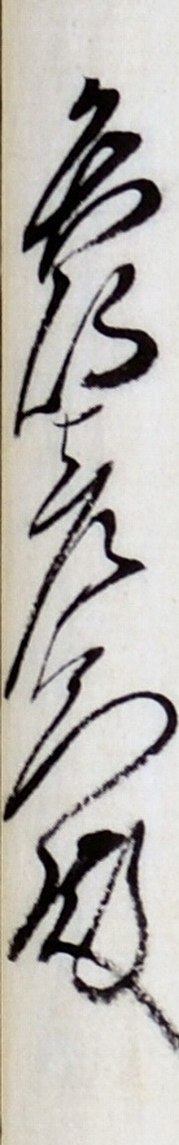矢嶋彦右衛門殿
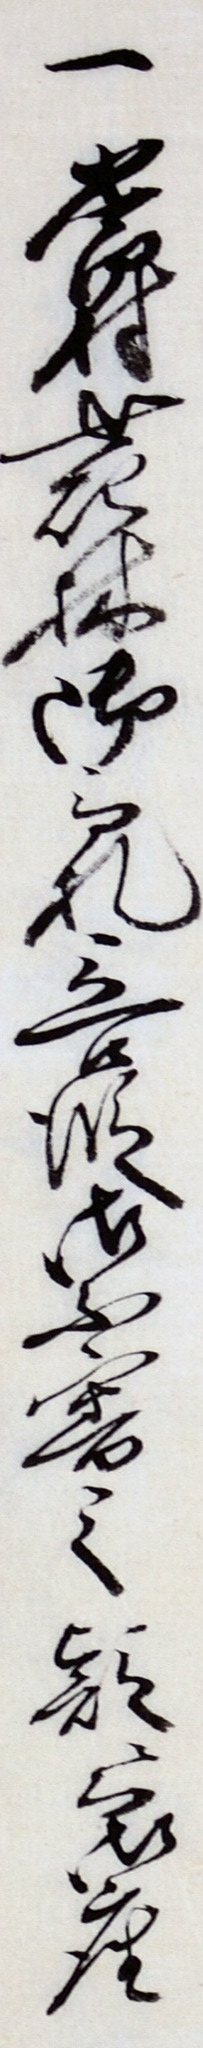一当村せき林御高札立候段御不審之疑ニ而御座
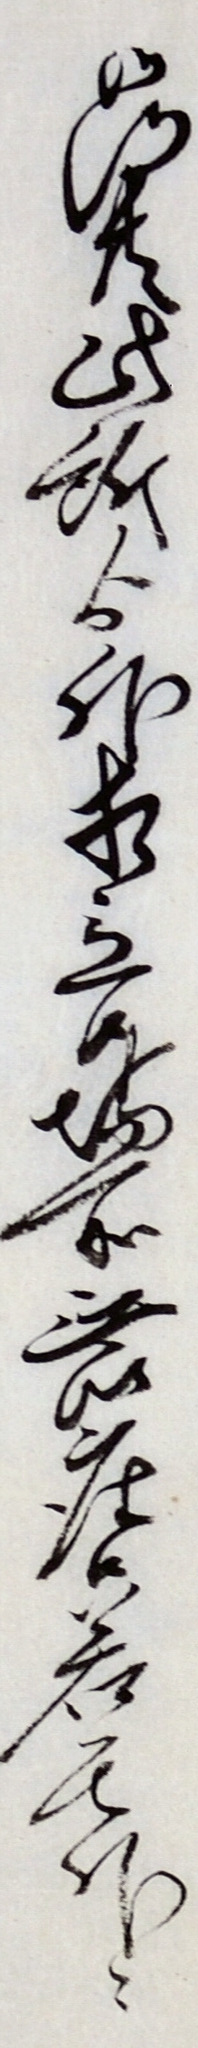候得共此所ゟ外相立候場所無御座候若其外ニ
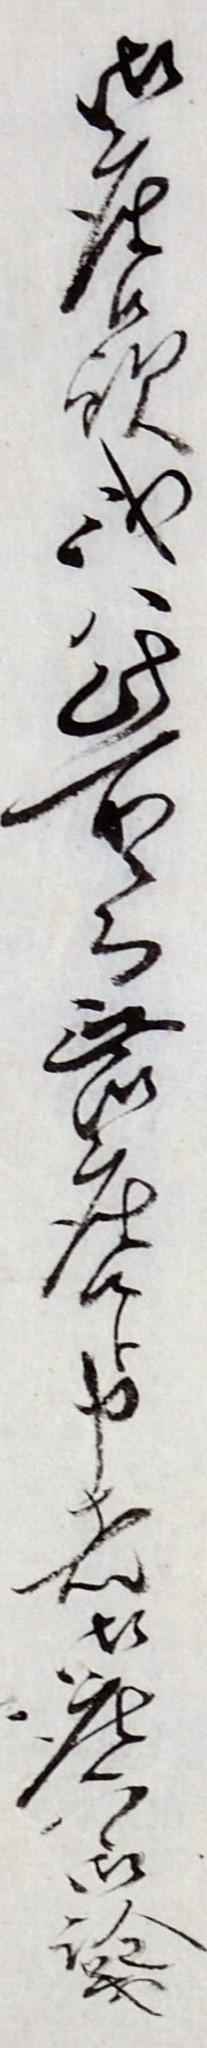御座候様或ハ此所ニ而無御座候ト申者御座候ハヽ御詮議
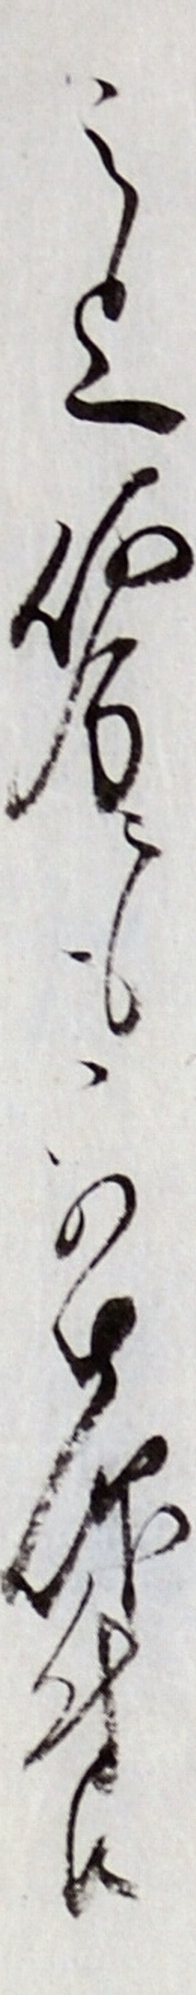之上何分ニも可被仰付候
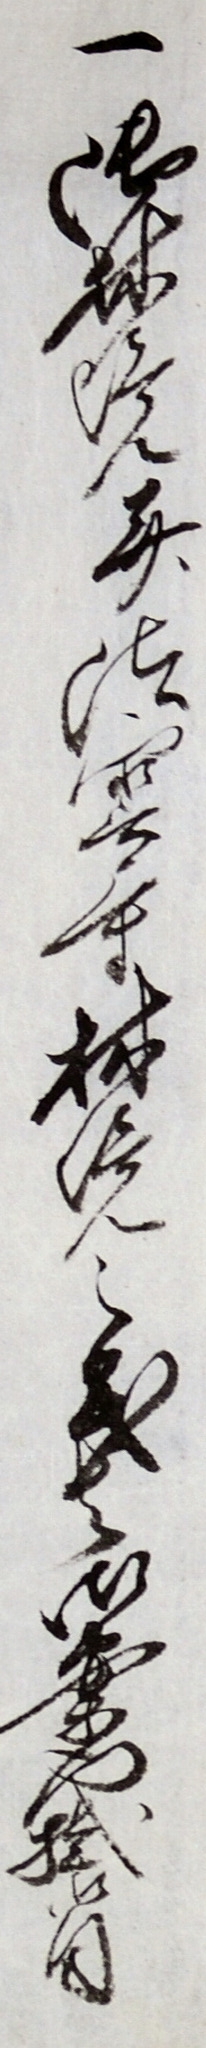一御林境并法雲寺林境之義は御案内掛御目
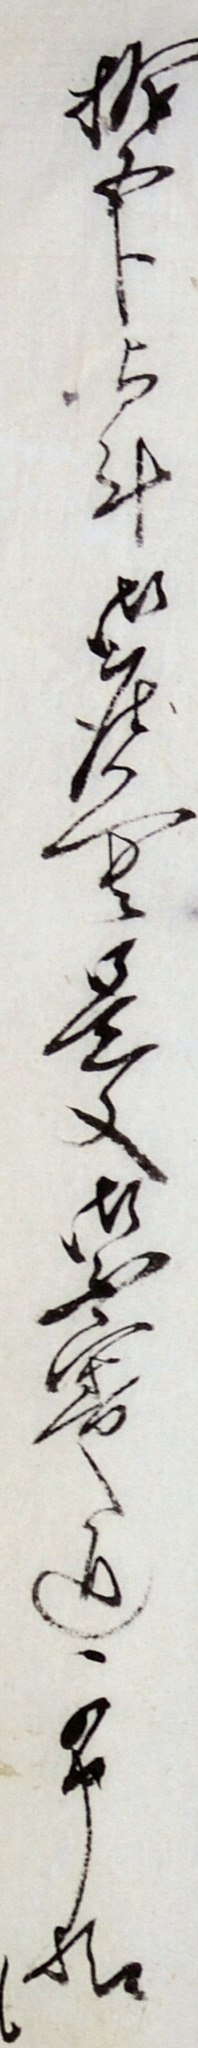拾五分与計御座候へは是又御不審之通可申様も

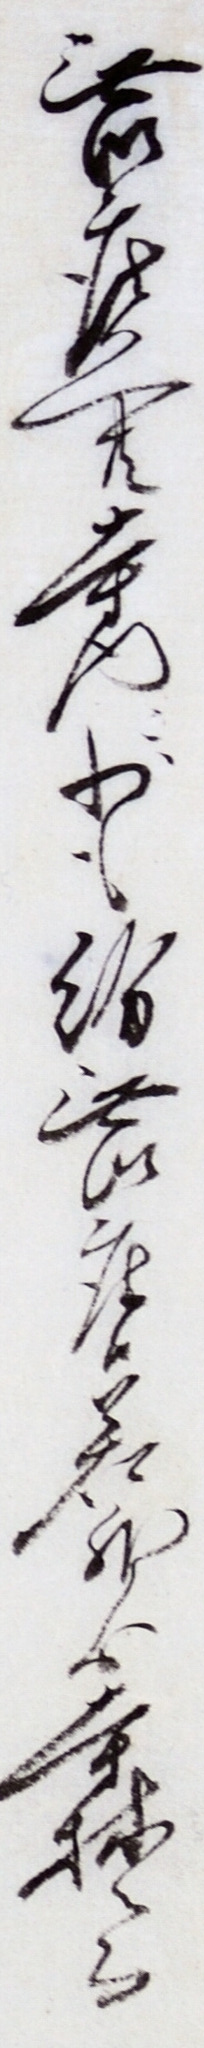無御座候へ共寺内ニ少も紛無御座候若外ゟ寺林ニ而
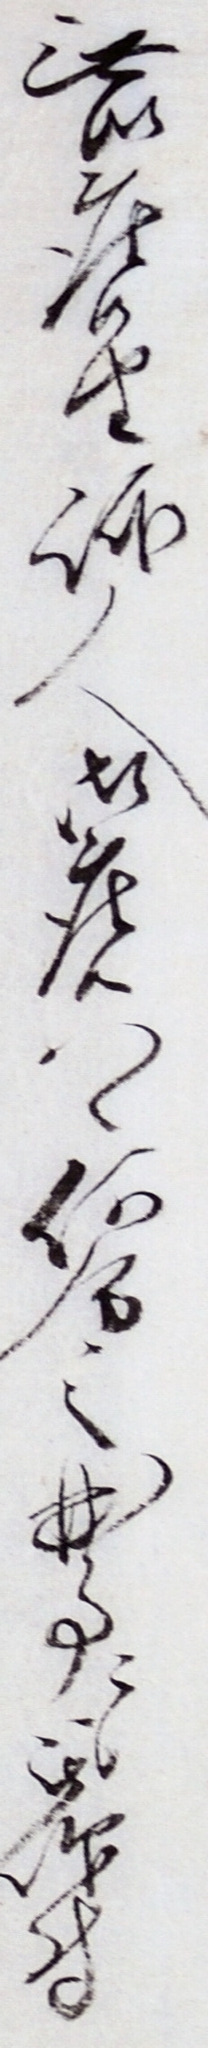無御座候由訴人御座候ハヽ何分之曲事ニも被仰付
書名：御林御竹藪証文控
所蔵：伊那市立高遠町図書館・合同会社AMANE
